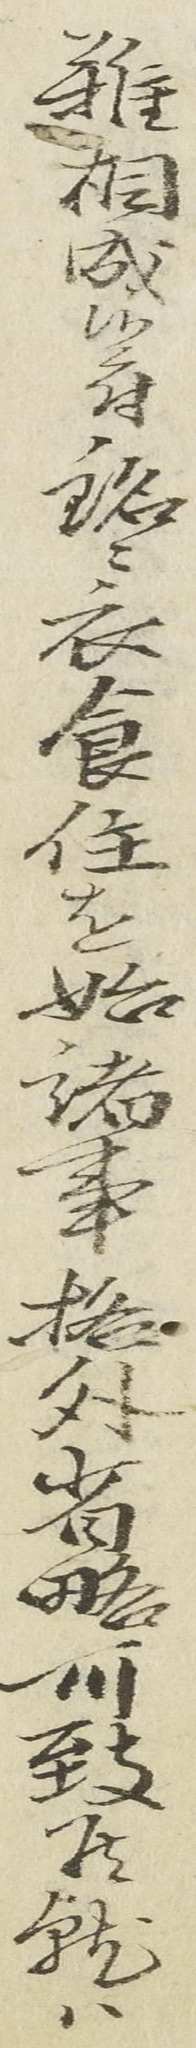難相候二付銘々衣食住を始諸事格外省略可致候就ハ
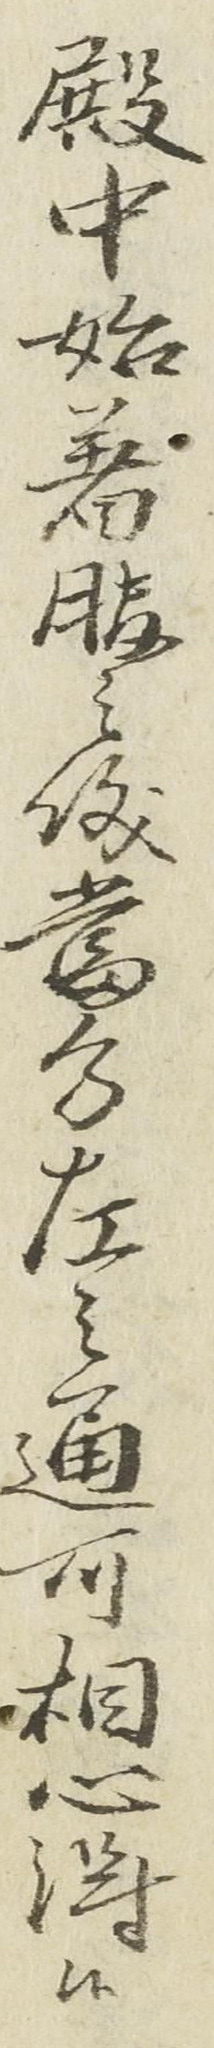殿中始着服之儀当方左之通可相心得候
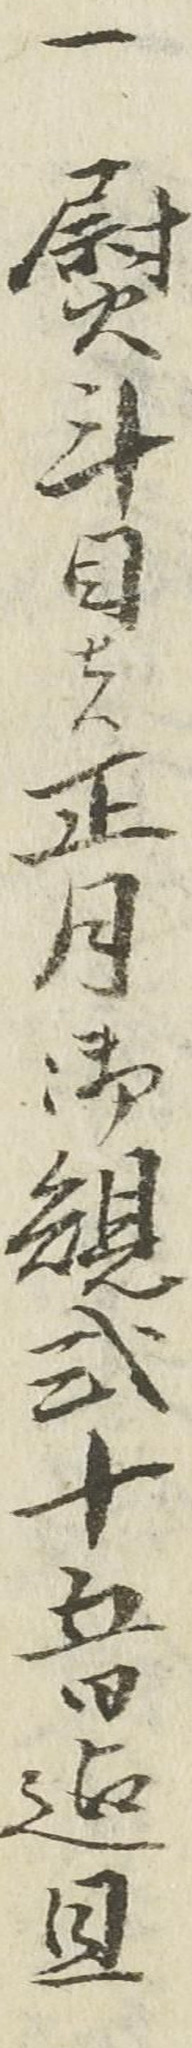一熨斗目は正月御規式十五日迄且
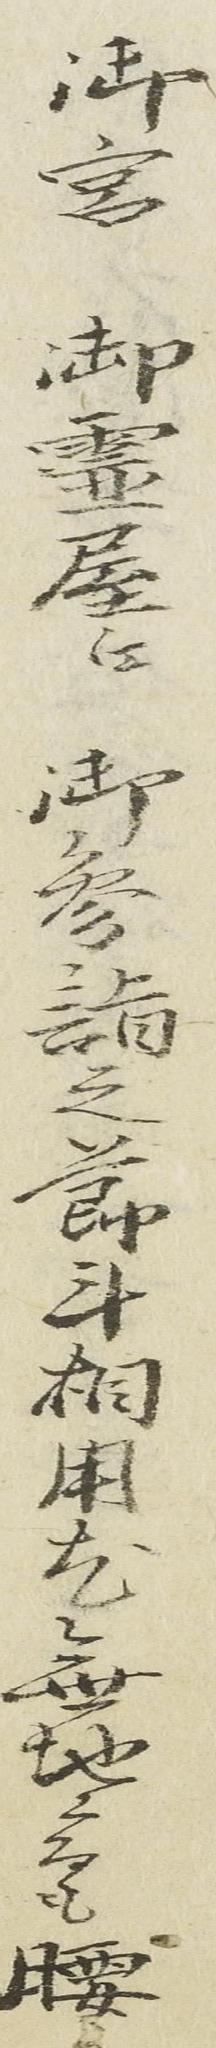御宮御霊屋え御参詣之節斗相用尤無地ニ而も腰
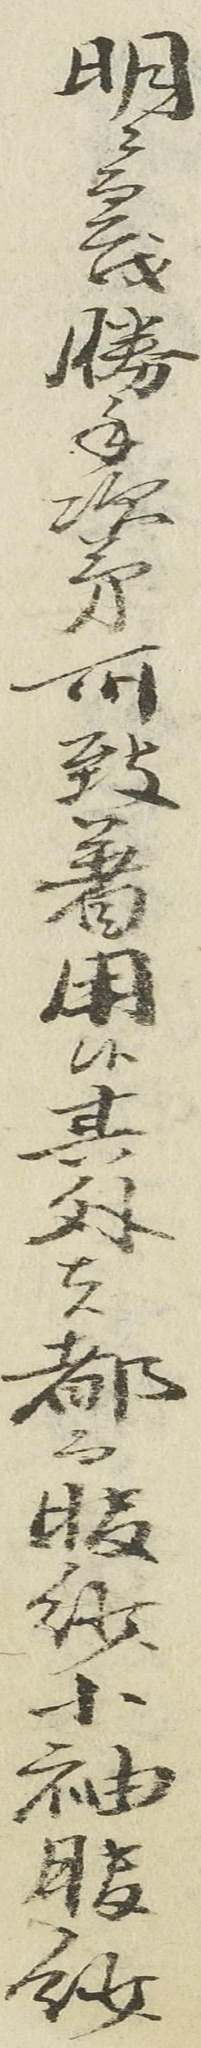明ニ而茂勝手次第可致着用候其外は都而服紗小袖服紗
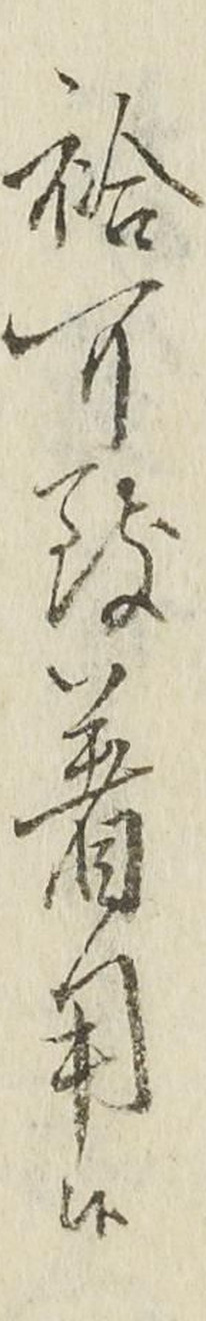袷可致着用候
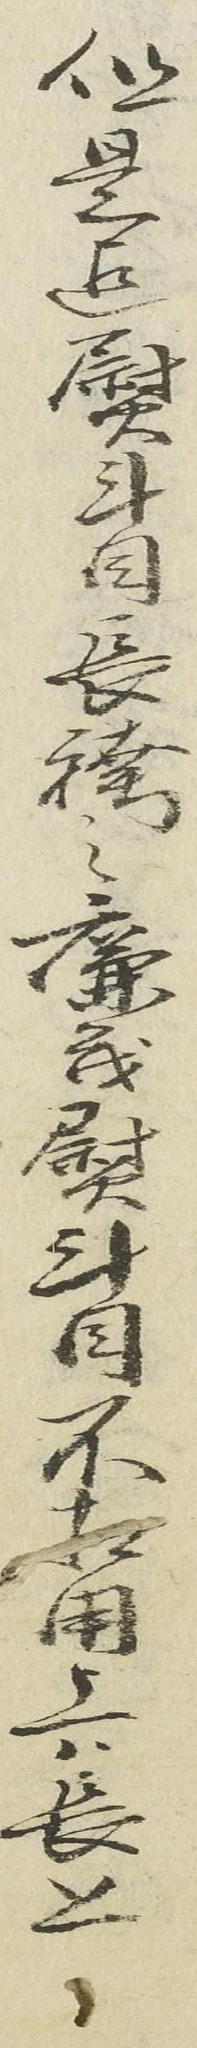但是迄熨斗目長袴之廉茂熨斗目不相用上ハ長上
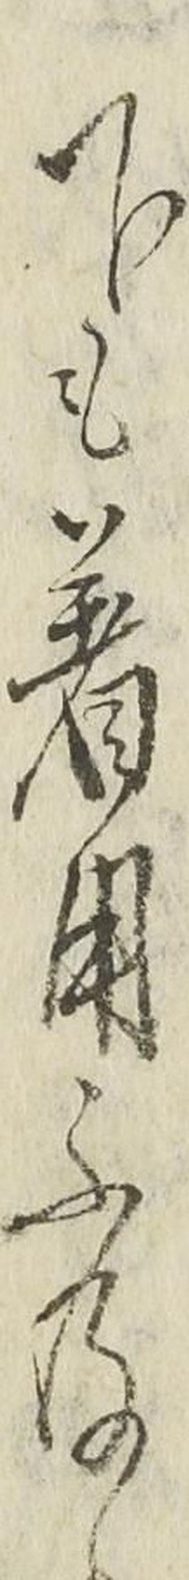下も着用不及候
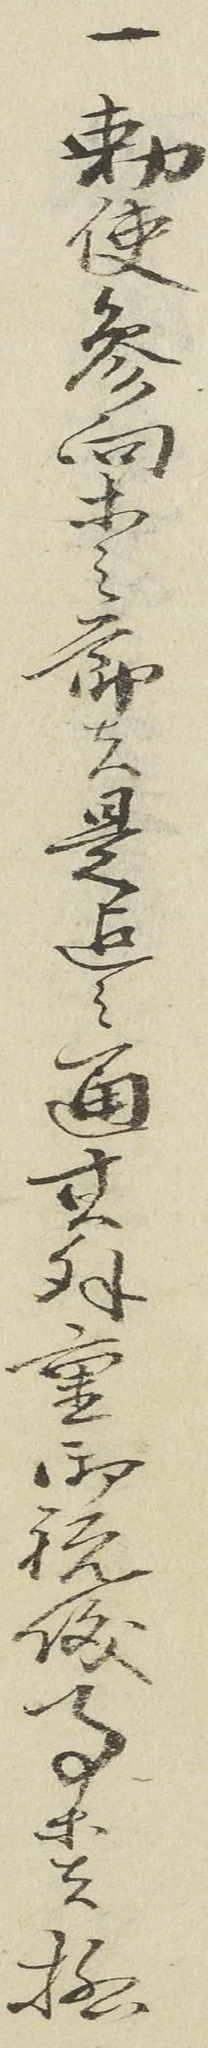一勅使参向等之節は是迄之通其外重御祝儀事等は格

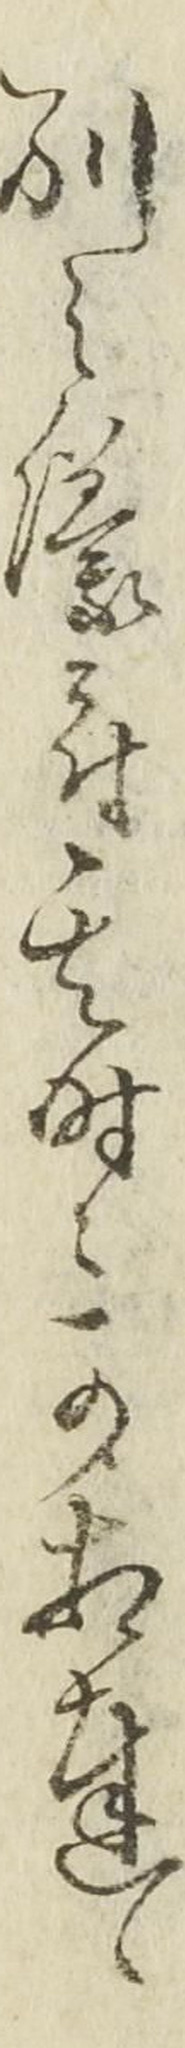別之儀に付其時に可相達候
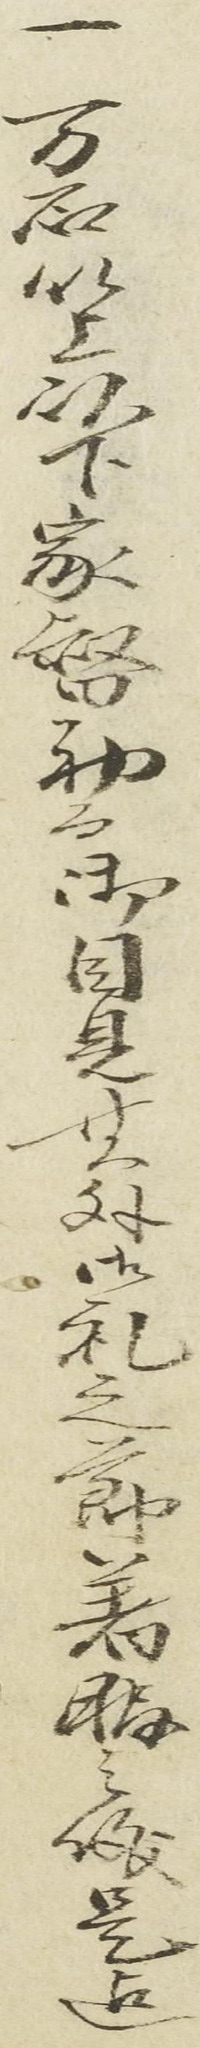一万石以上以下家督初而御目見其外御礼之節着服之儀是迄
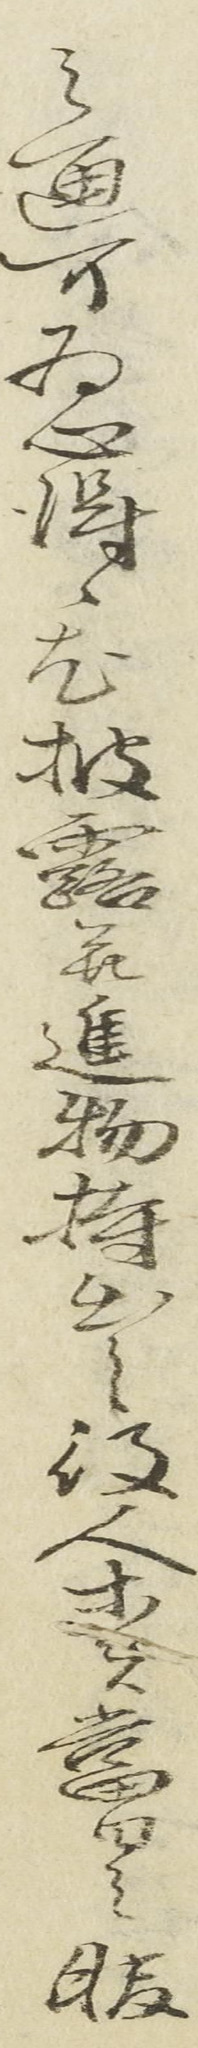之通可為心得候尤披露幷進物持出し役人等は当日之服
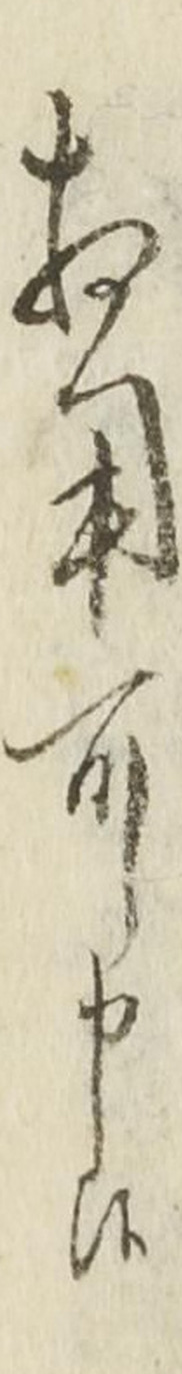相用可申候
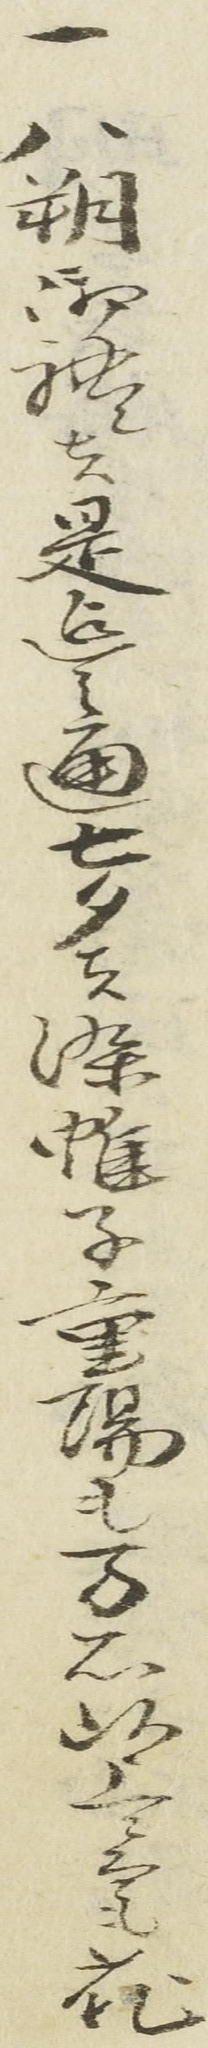一八朔御礼は是迄之通七夕は染帷子重陽も万石以上二而も
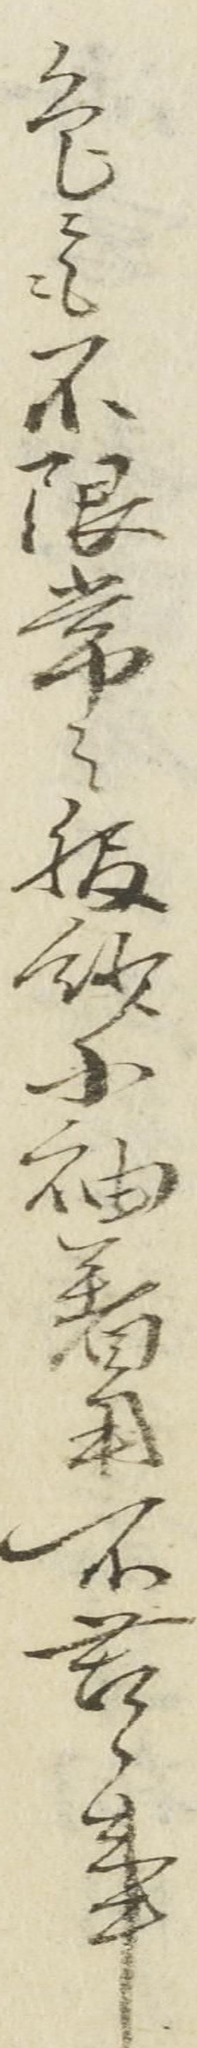花色二も不限常之服紗小袖着用不苦候事
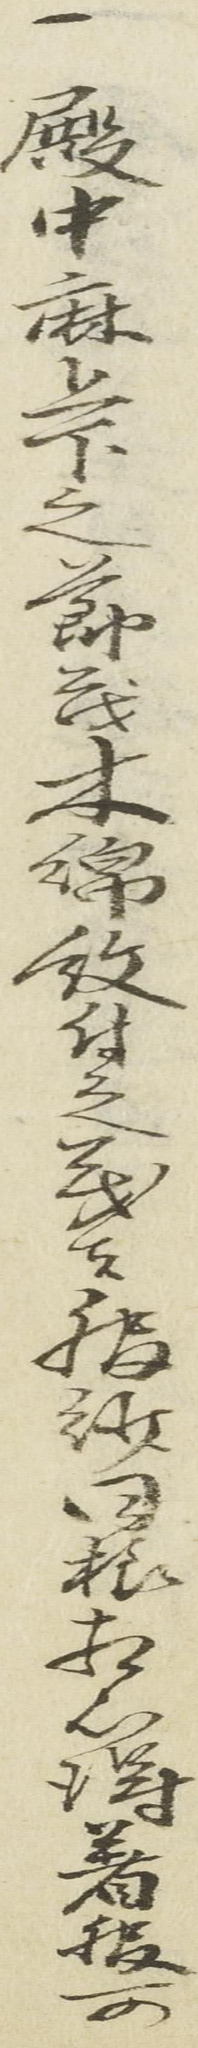一殿中麻上下之節茂木綿紋付之義は服紗同様相心得着服可
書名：安政二乙卯年十月二日大地震之事
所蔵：東京大学地震研究所図書室 Earthquake Research Institute Library, The University of Tokyo, JAPAN
